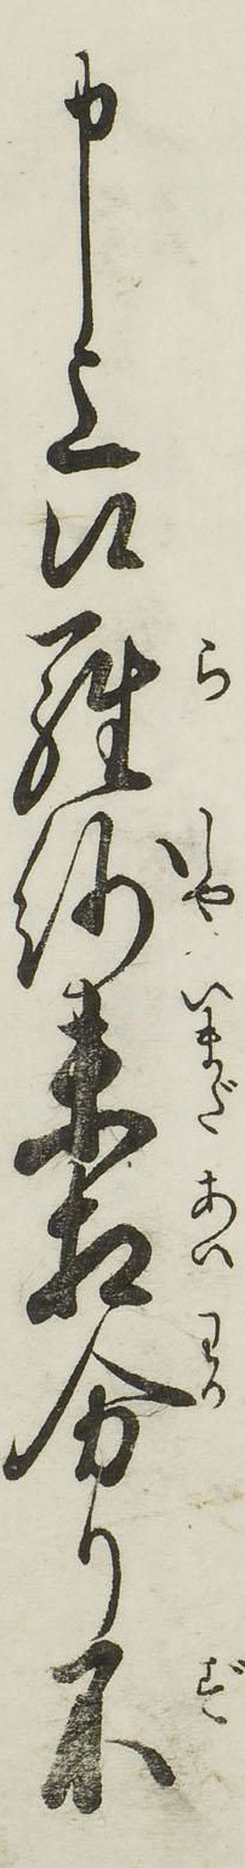申上候羅紗未相分り不

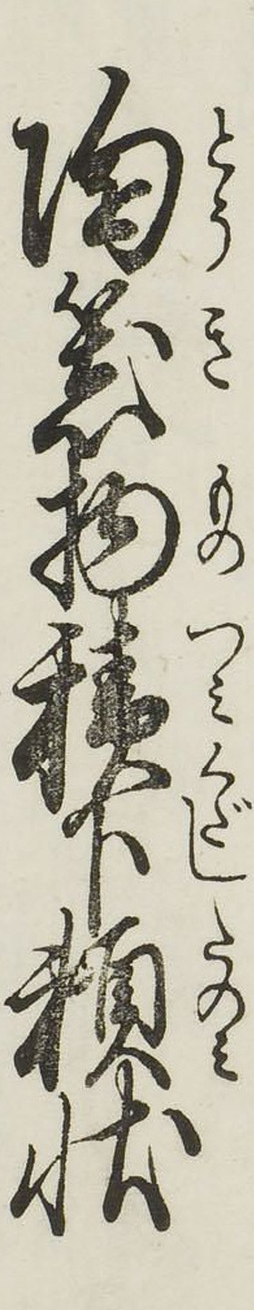陶器物積下頼状
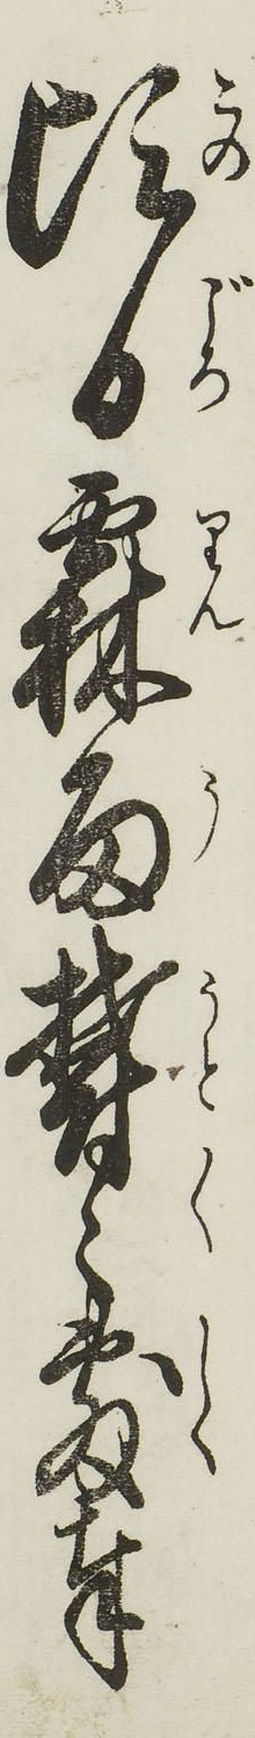頃日霖雨鬱々敷奉

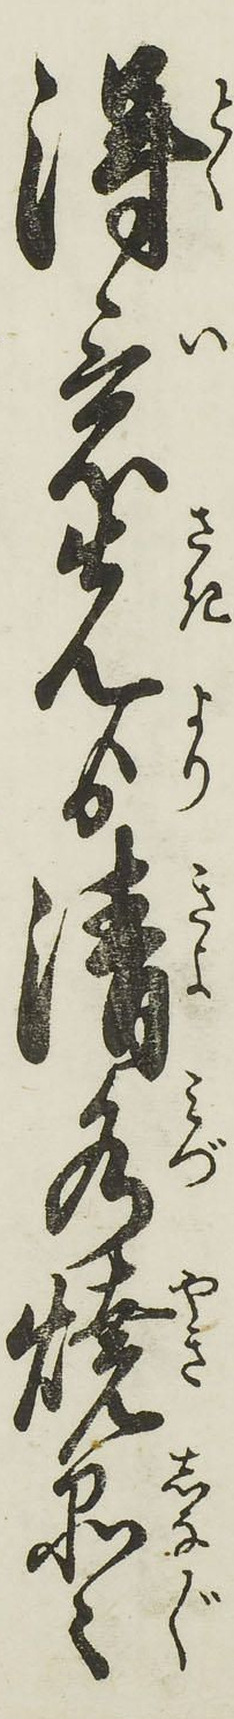得意先ゟ清水焼品々
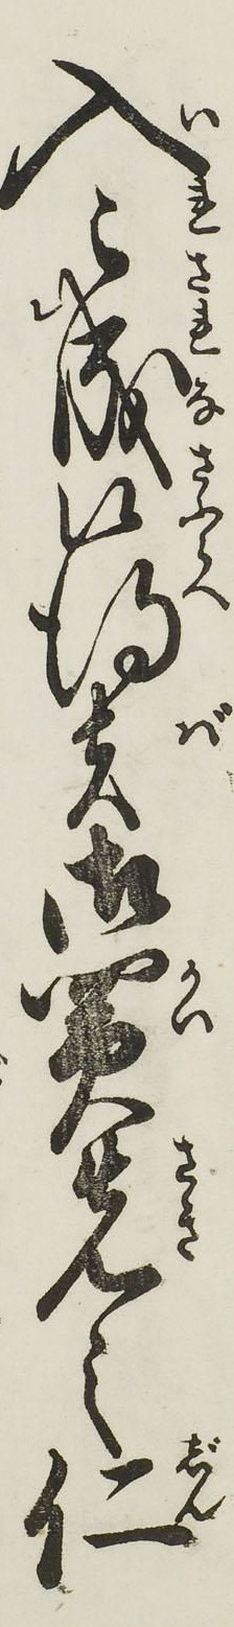入被成候者御買先之仁

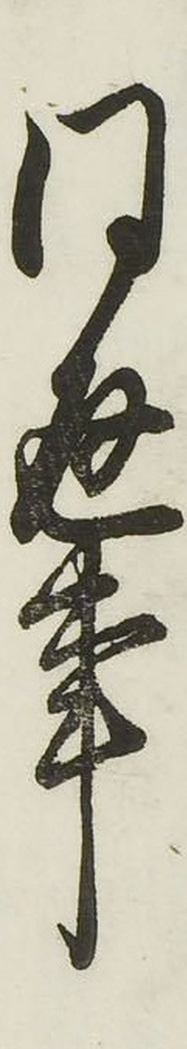同返事
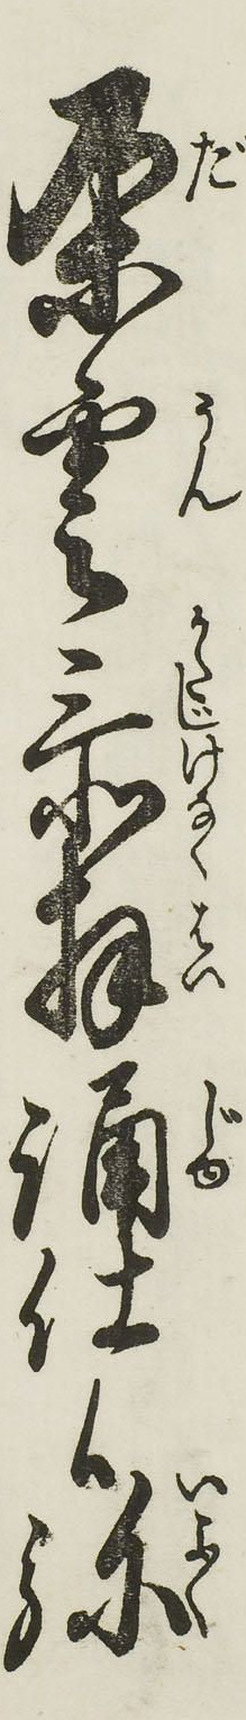朶雲忝拝誦仕候弥
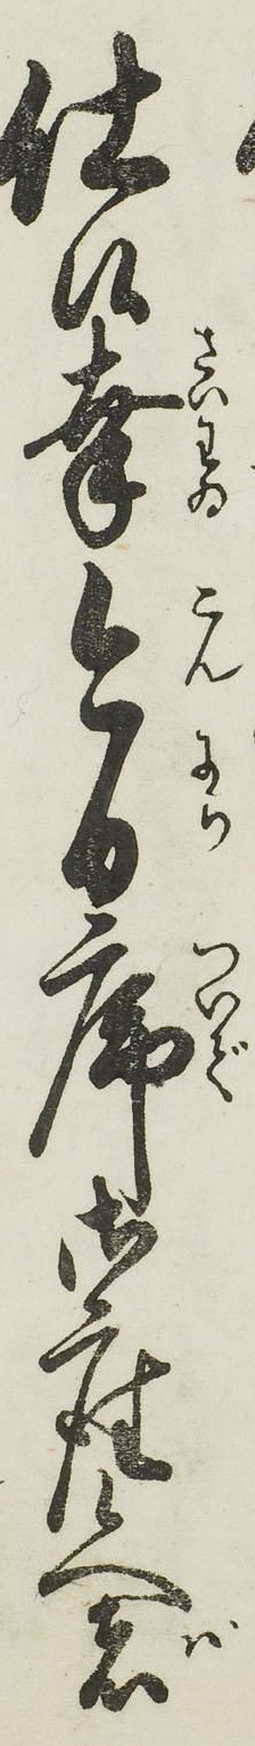仕候幸今日序御座候へ者

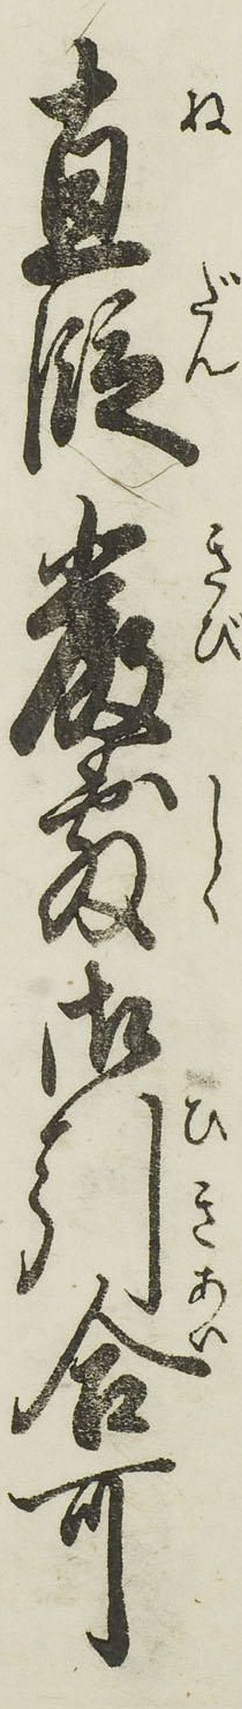直段厳敷御引合可
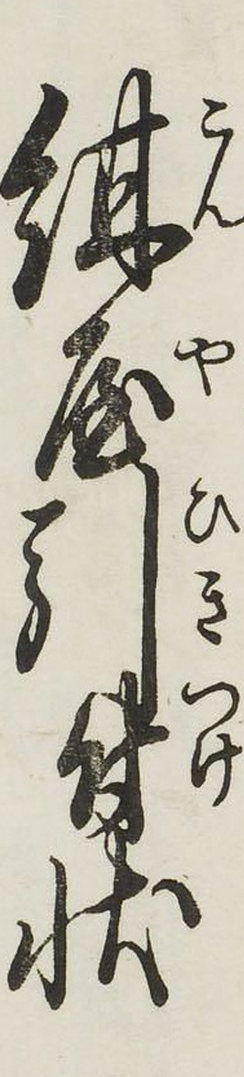紺屋引付状
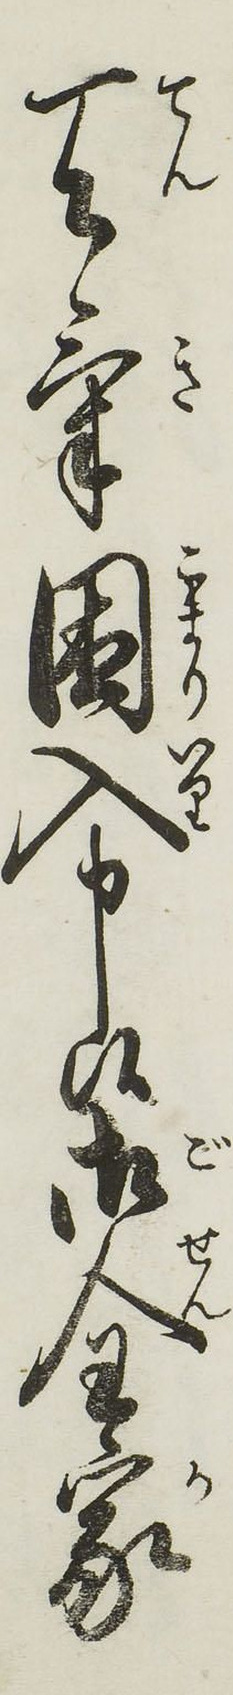天気困入申候御全家
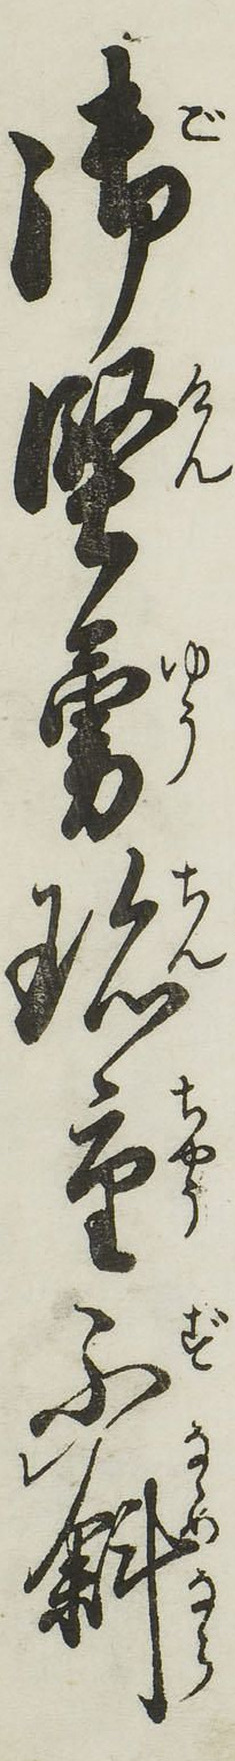御堅勇珍重不斜

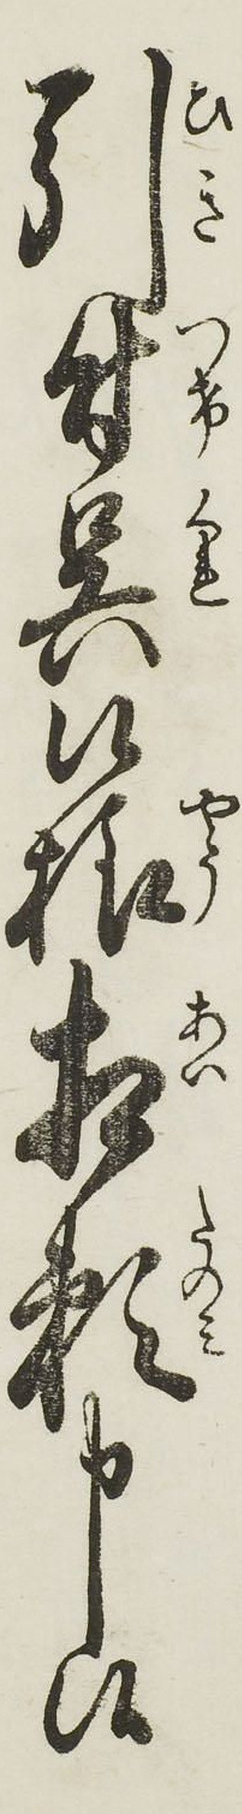引付呉候様相頼申候
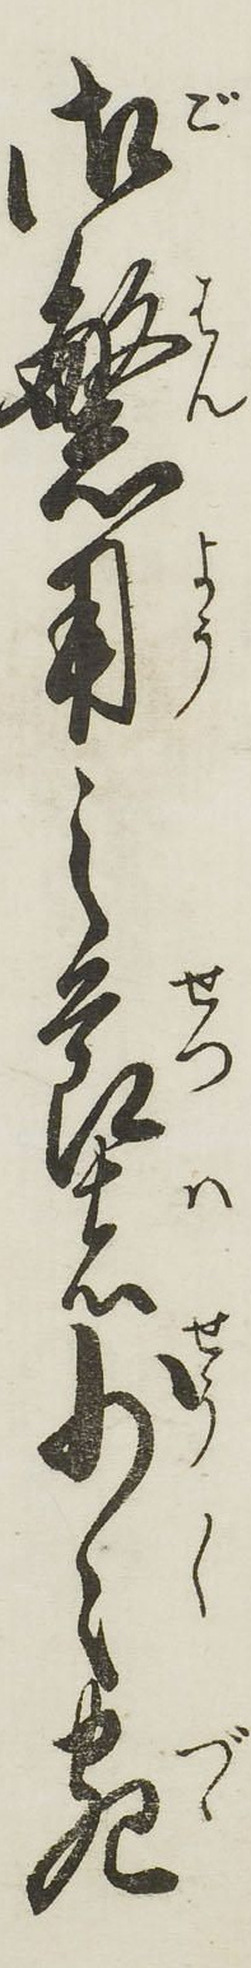御繁用之節者少々宛

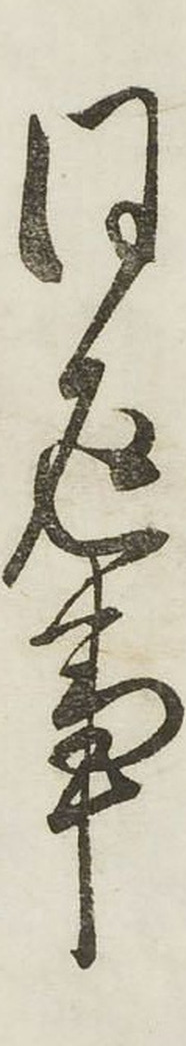同返事
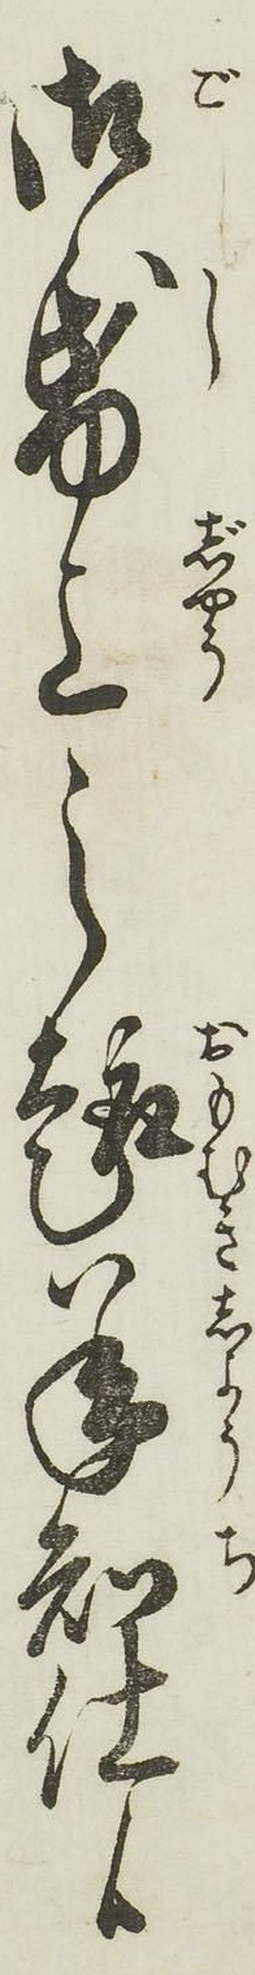御紙上之趣承知仕候
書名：商人書翰便覧
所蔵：東京学芸大学教育コンテンツアーカイブ
